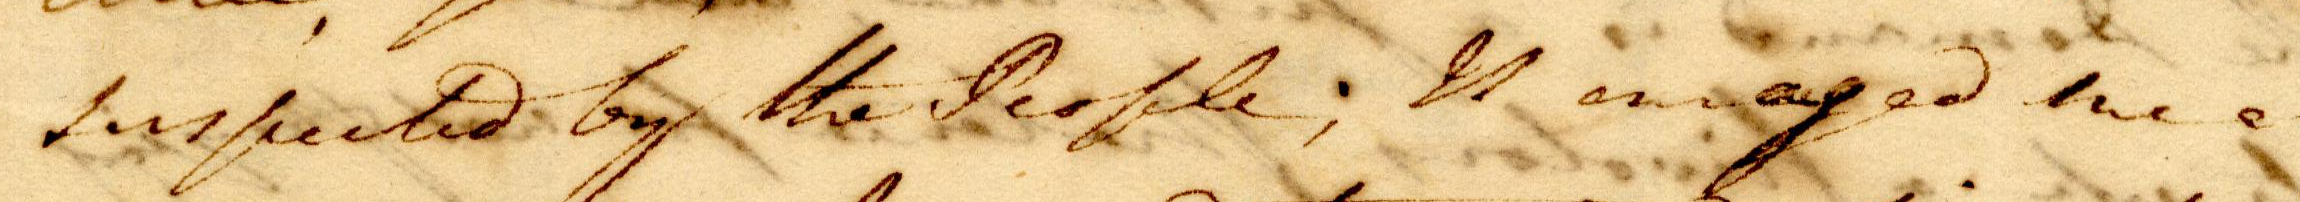suspected by the People; It enraged me a
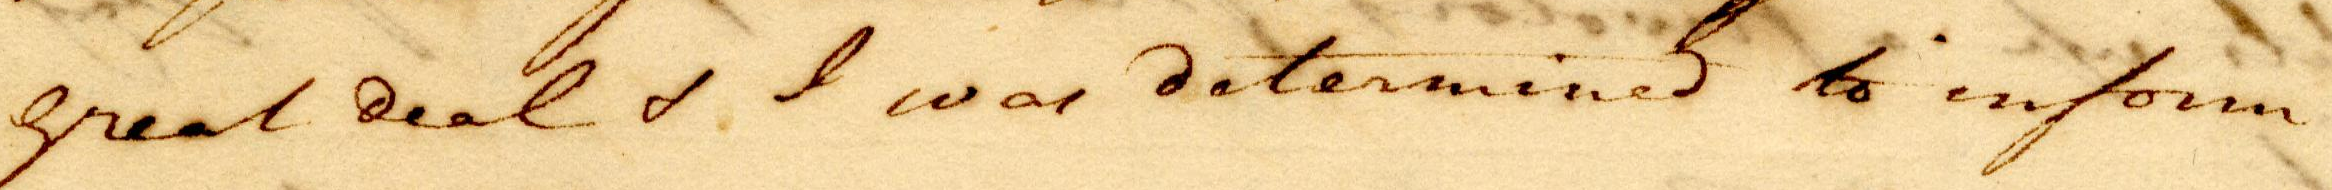great deal & I was determined to inform
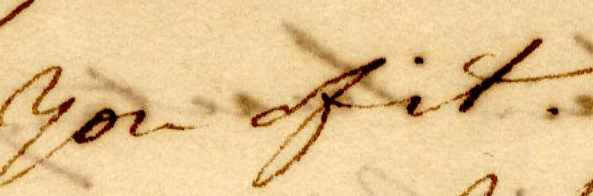You of it.
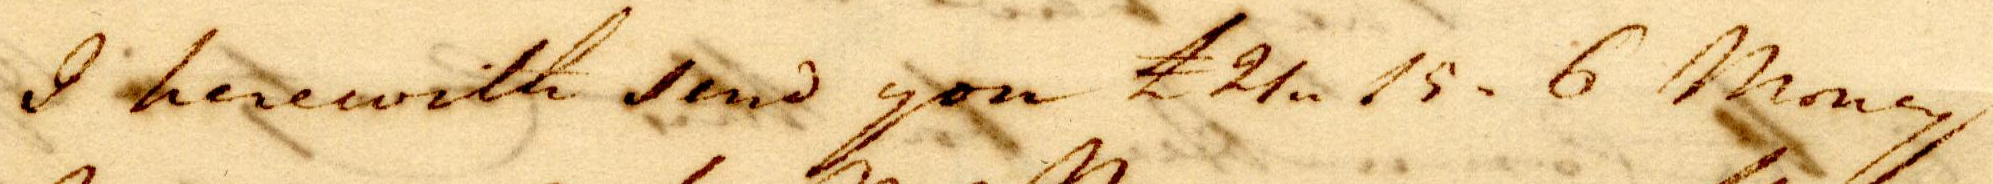I herewith send you £21. 19. 6 Money
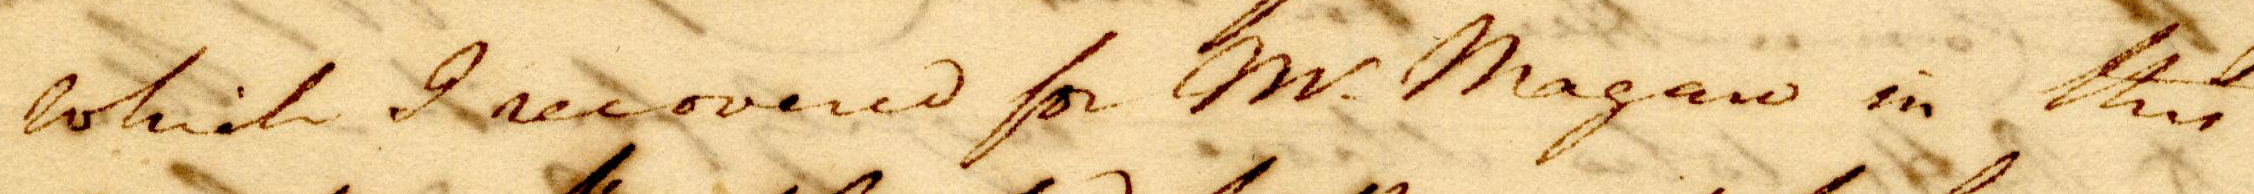which I recovered for M^r. Magar in this
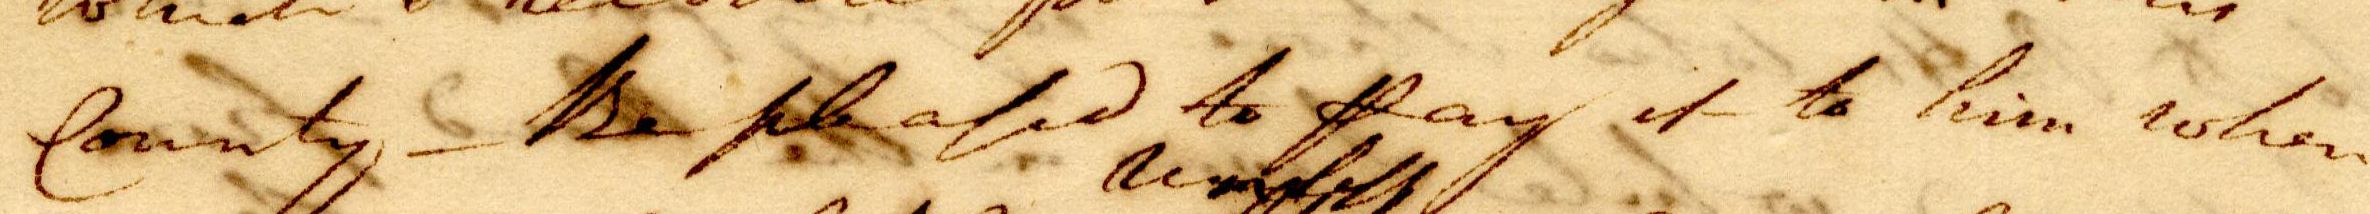County. Be pleasd to pay it to him when
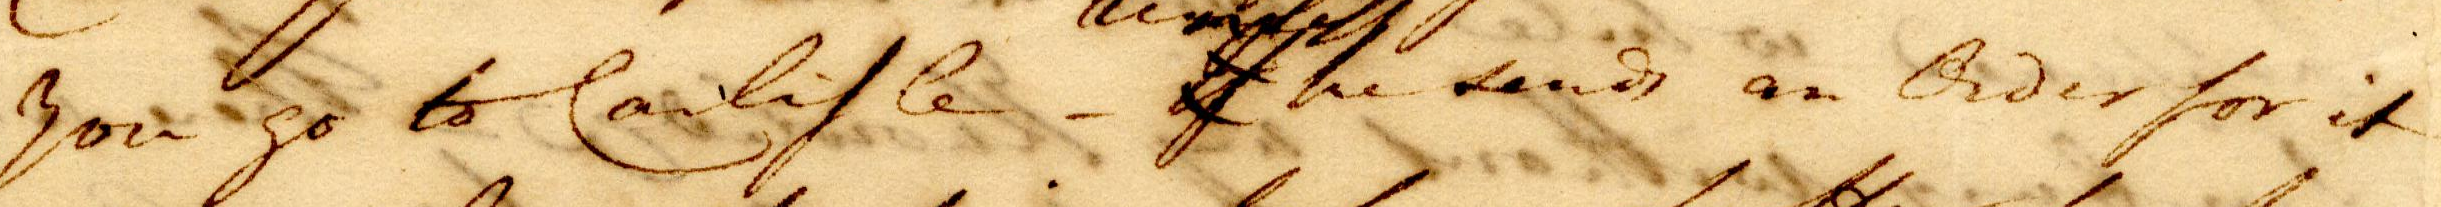You go to Carlisle- [if] he send an order for it
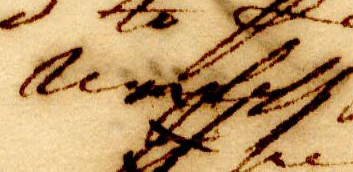unless
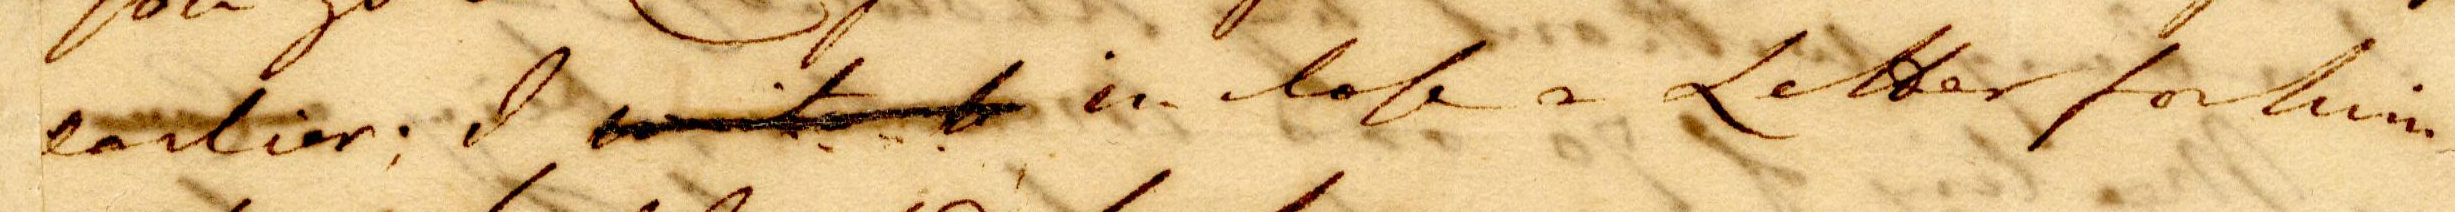earlier; I [write to] inclose a Letter for him
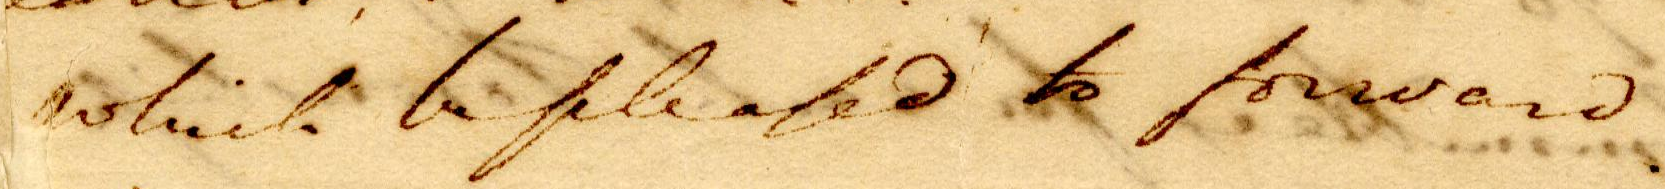which be pleased to forward.
